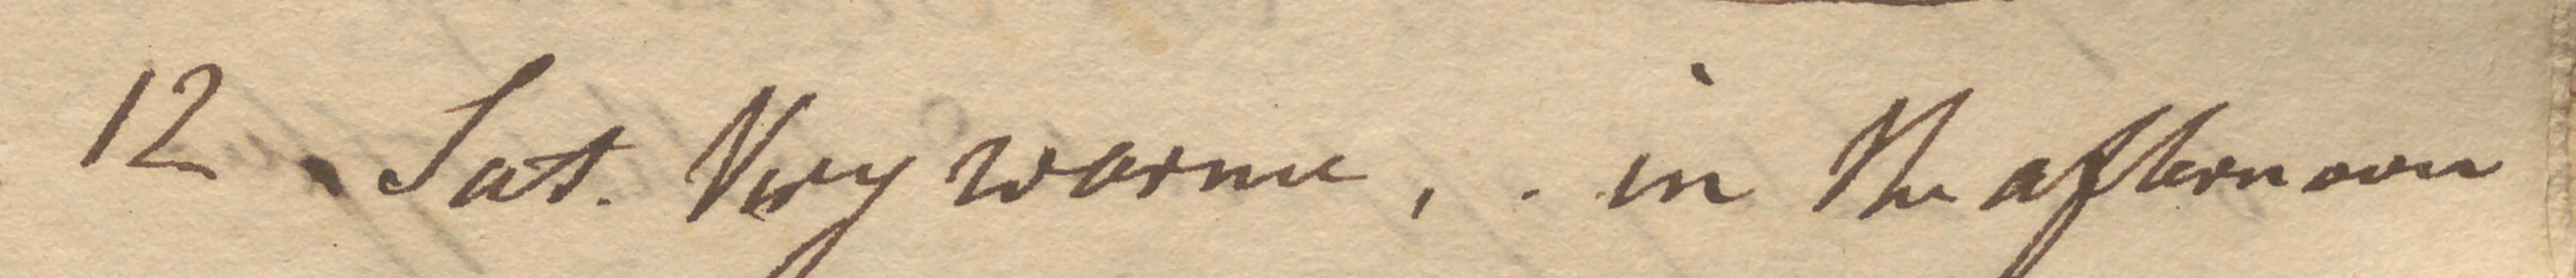12 Sat. Very warme, in the afternoon
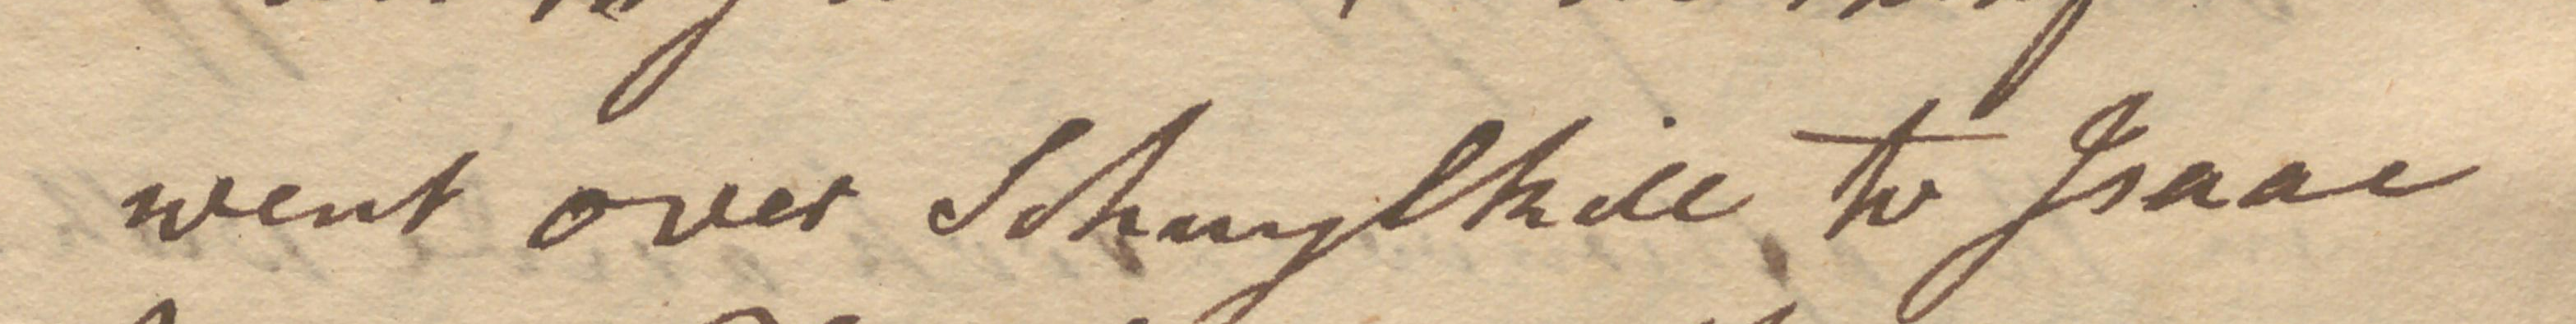went over Schuylkill to Isaac
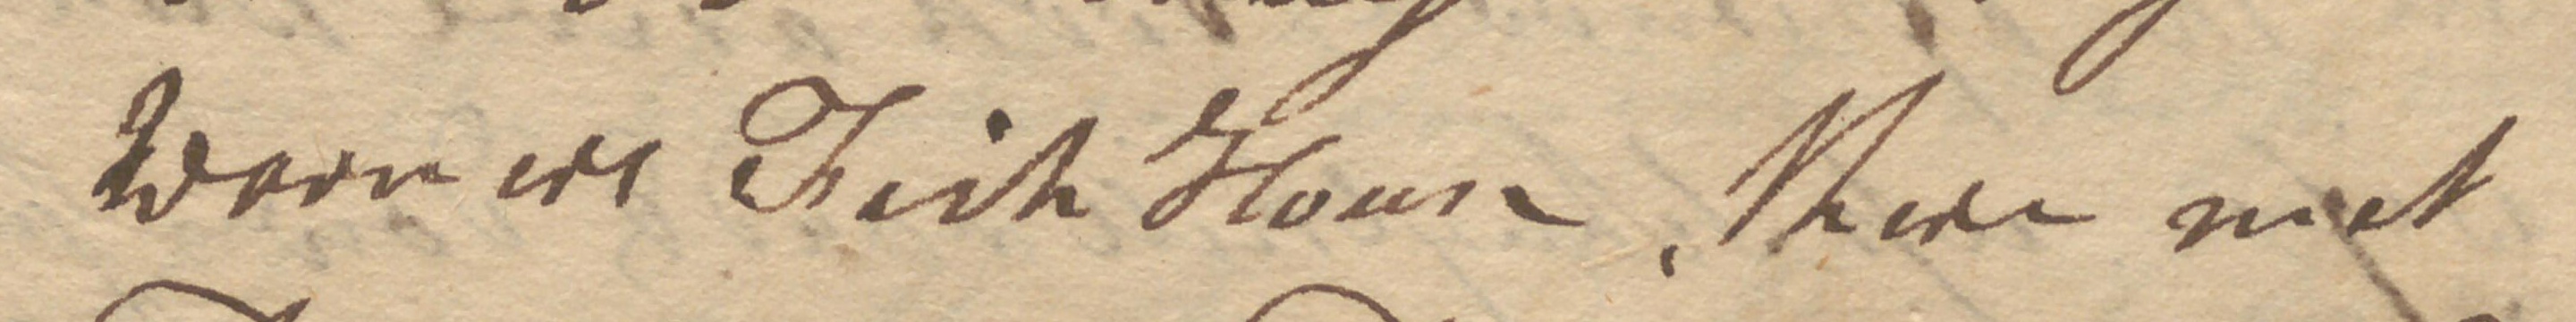Warners Fish House there met
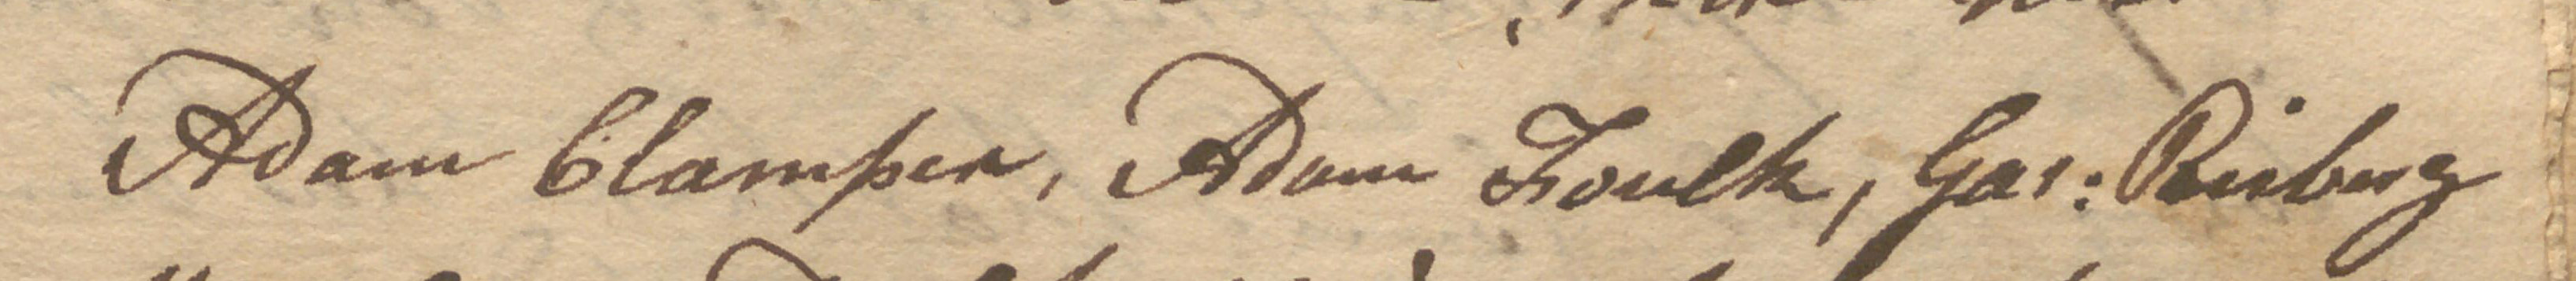Adam Clamper, Adarn Foulk, Gas. Reiburg
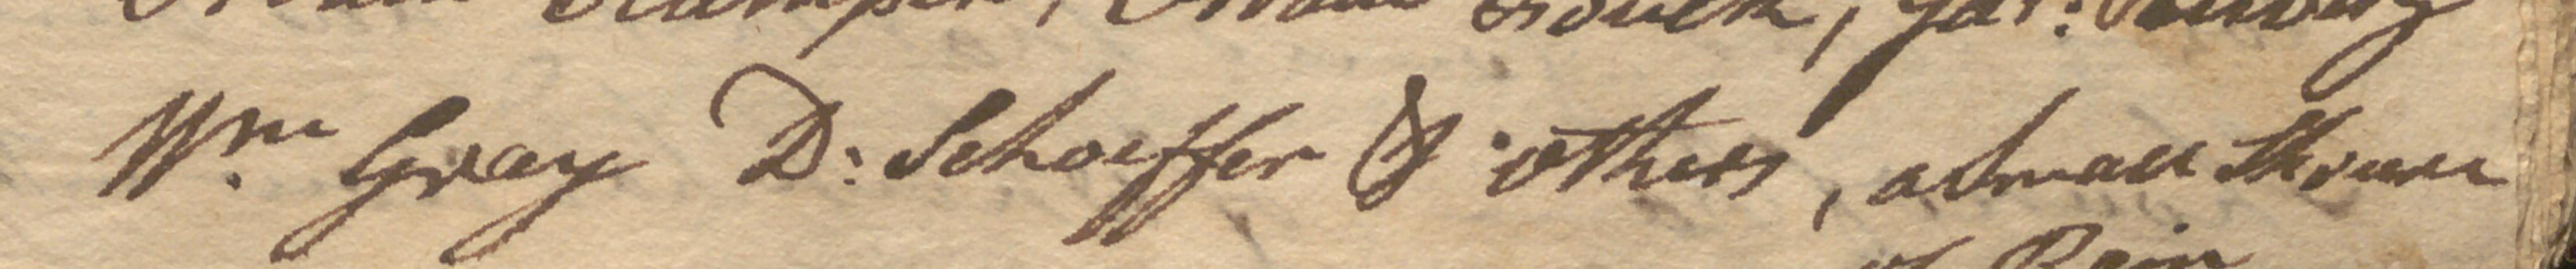W^m. Gray D. Schoeffer & others, a small shoure
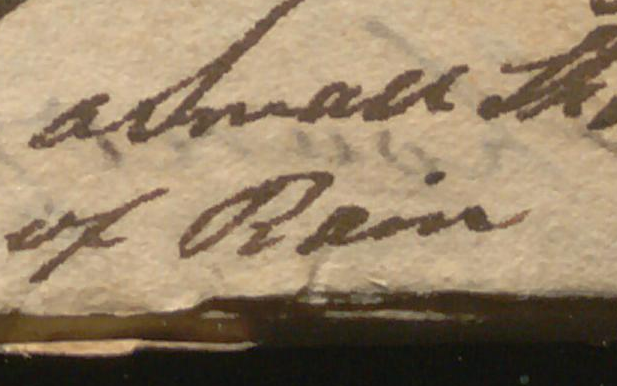£ Rain
